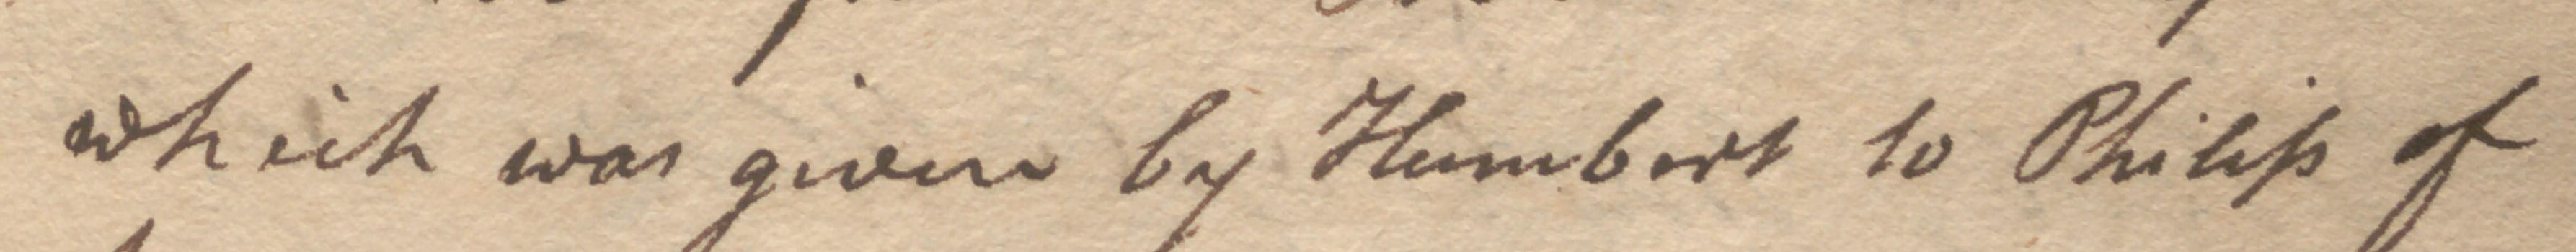which was given by Humbert to Philip of
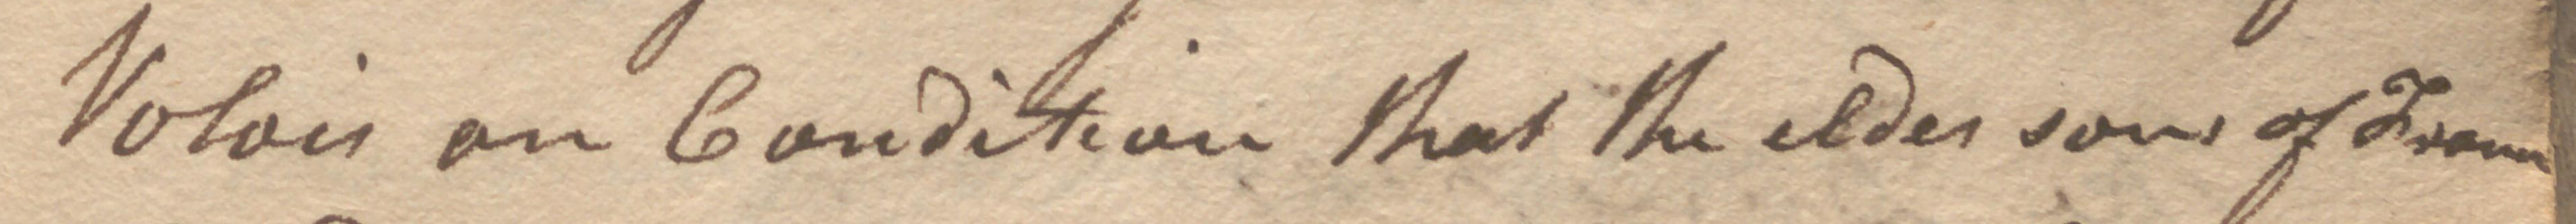Volois on Conditon that the elder sons of France
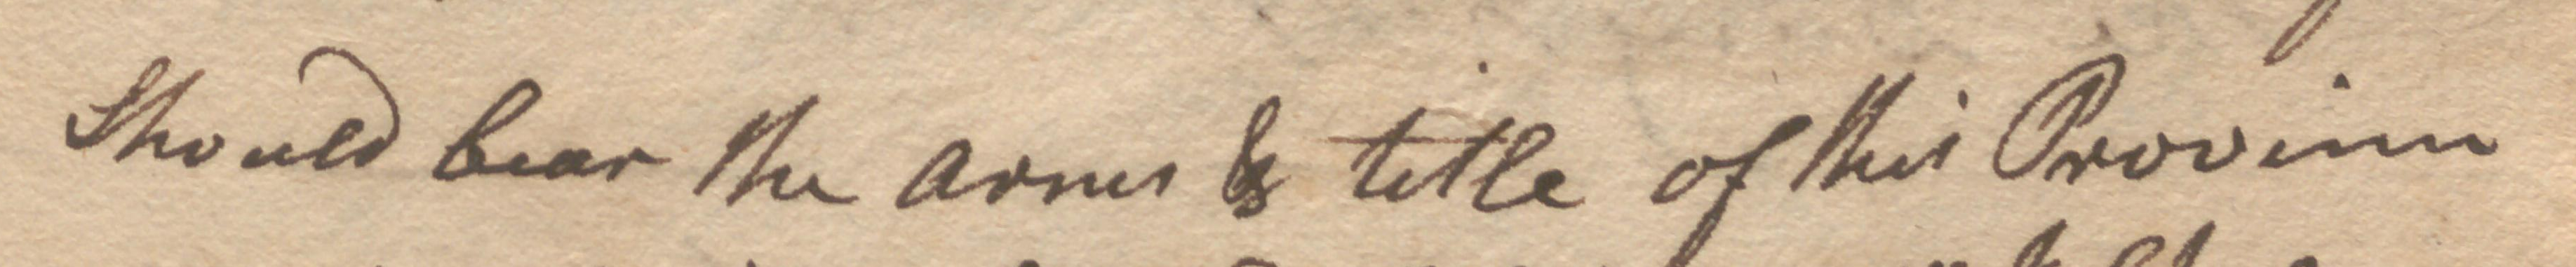Should bear the arms & title of this Province
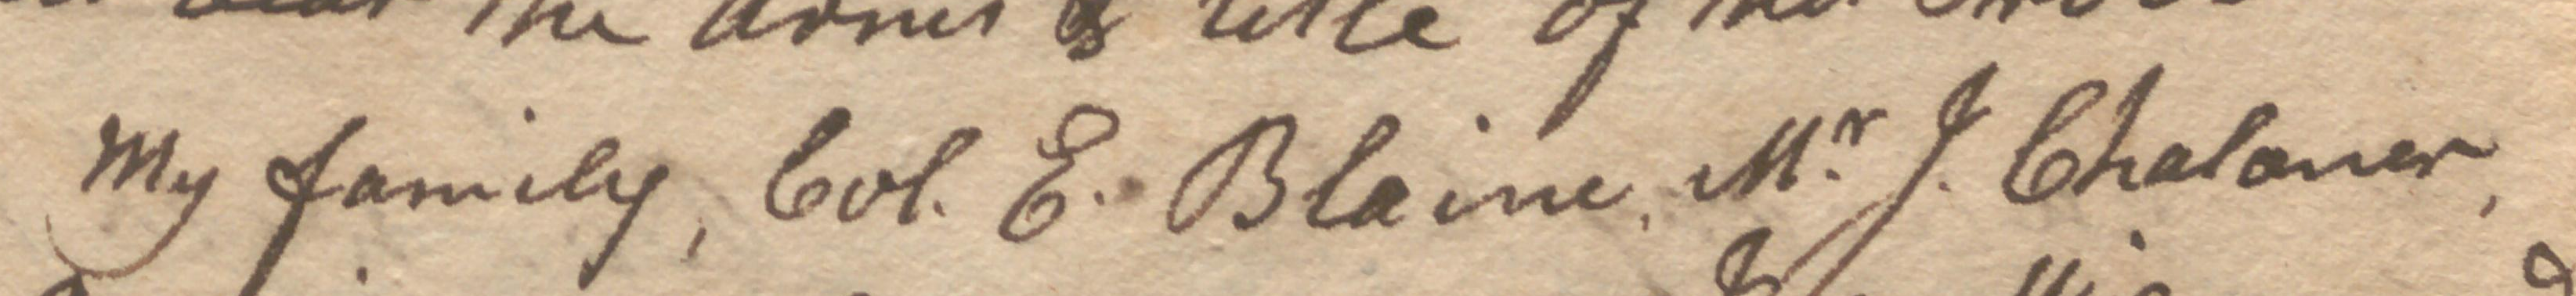My family, Col. E. Blain M^r. J. Chalaner
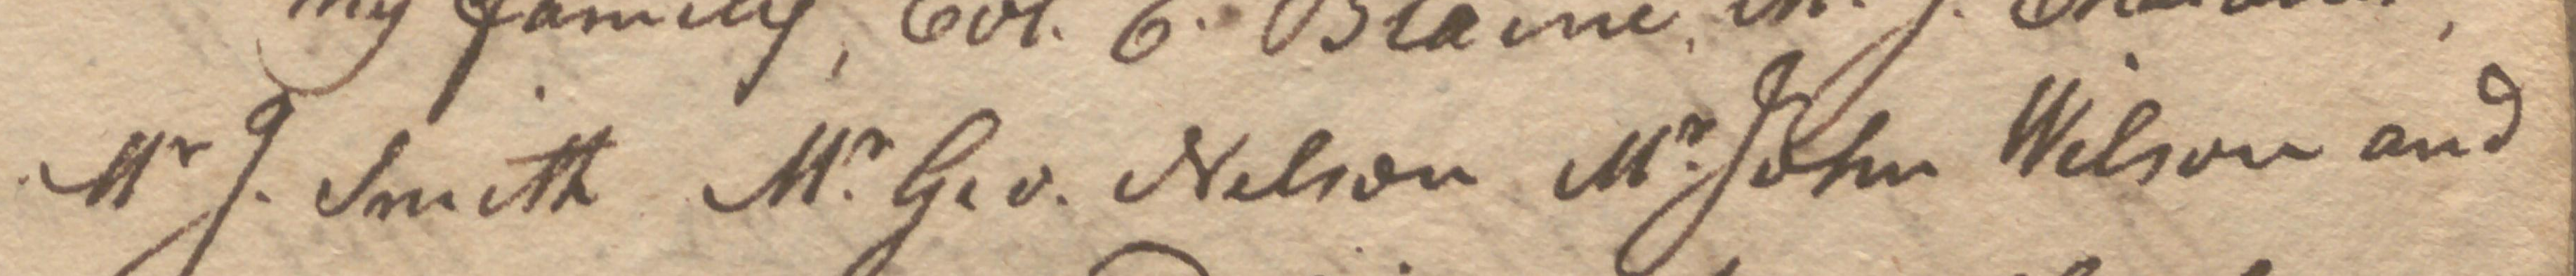M^r J. Smith M^r. Geo. Nelson M^r. John Wilson and
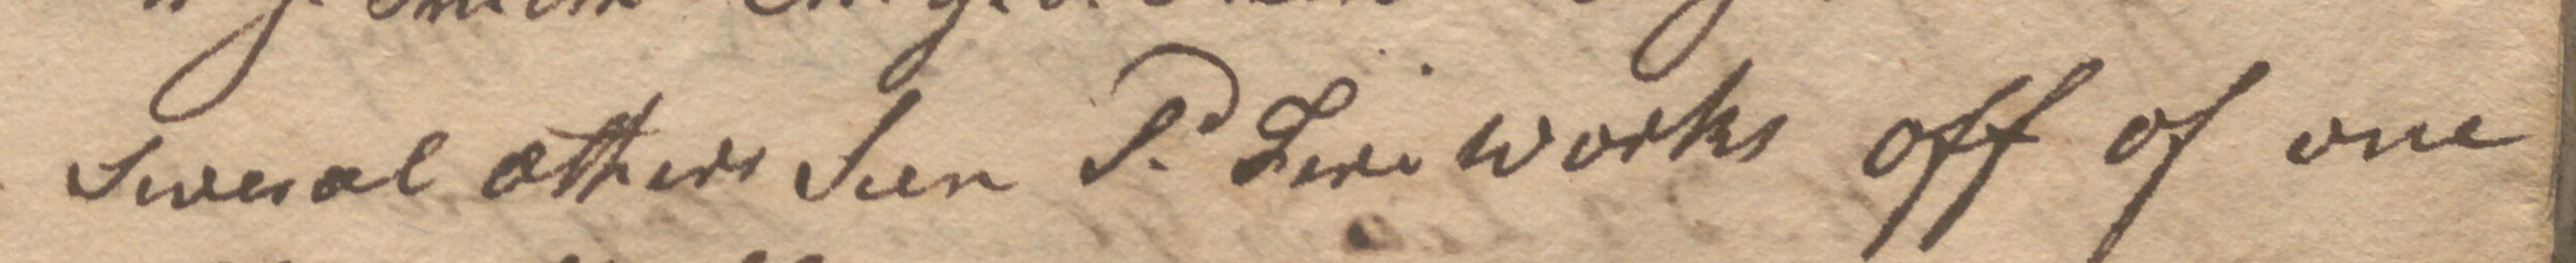several others seen s^d. Fire works off of one
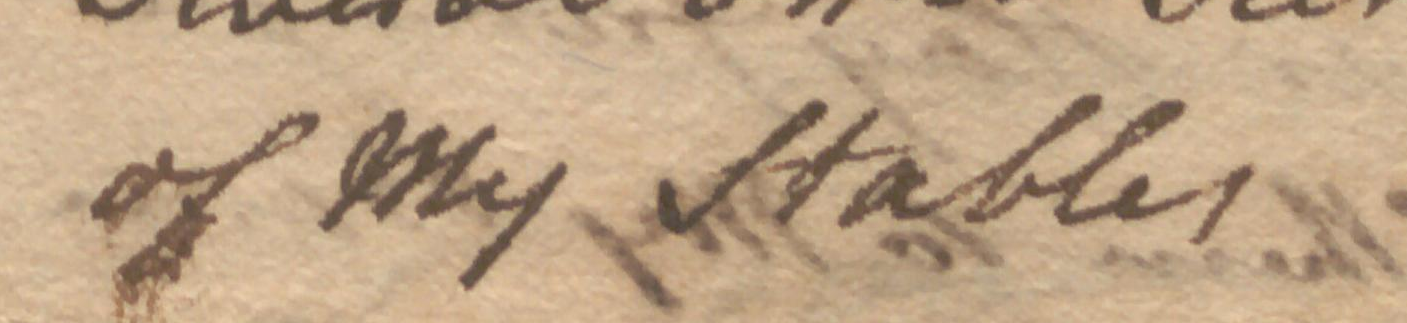of My Stables
